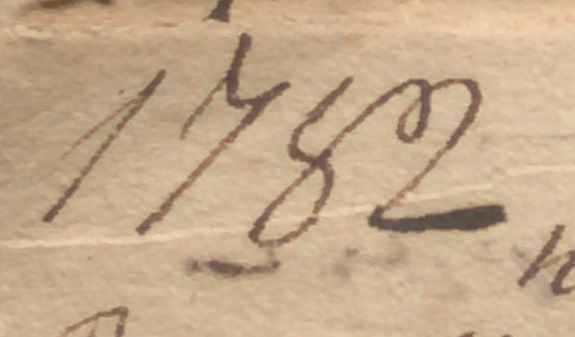1782
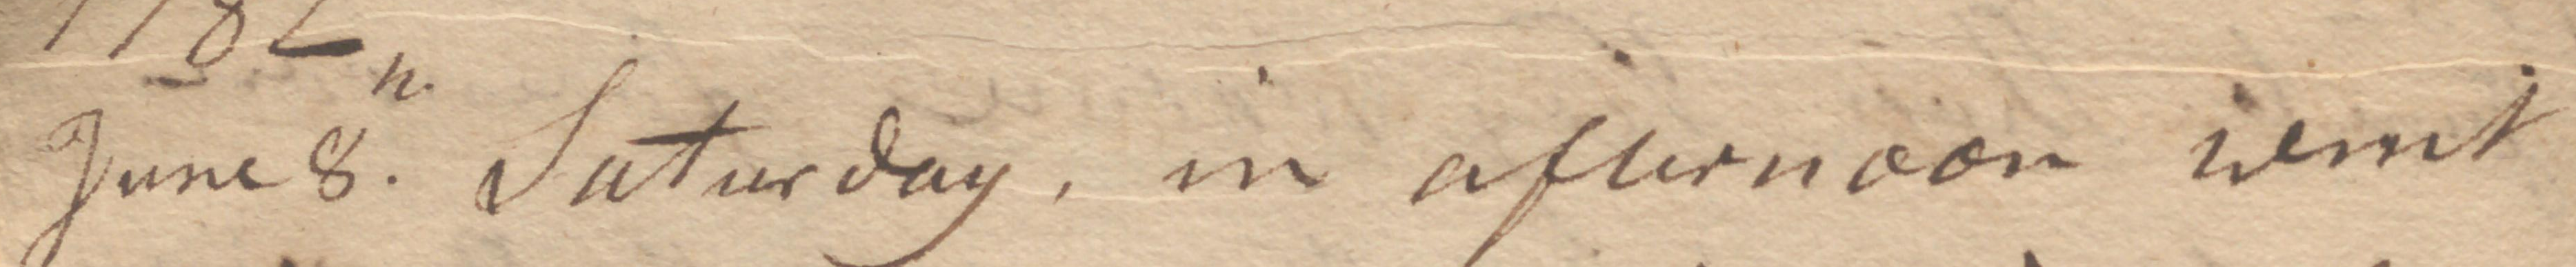June 8^th. Saturday, in afternoon went
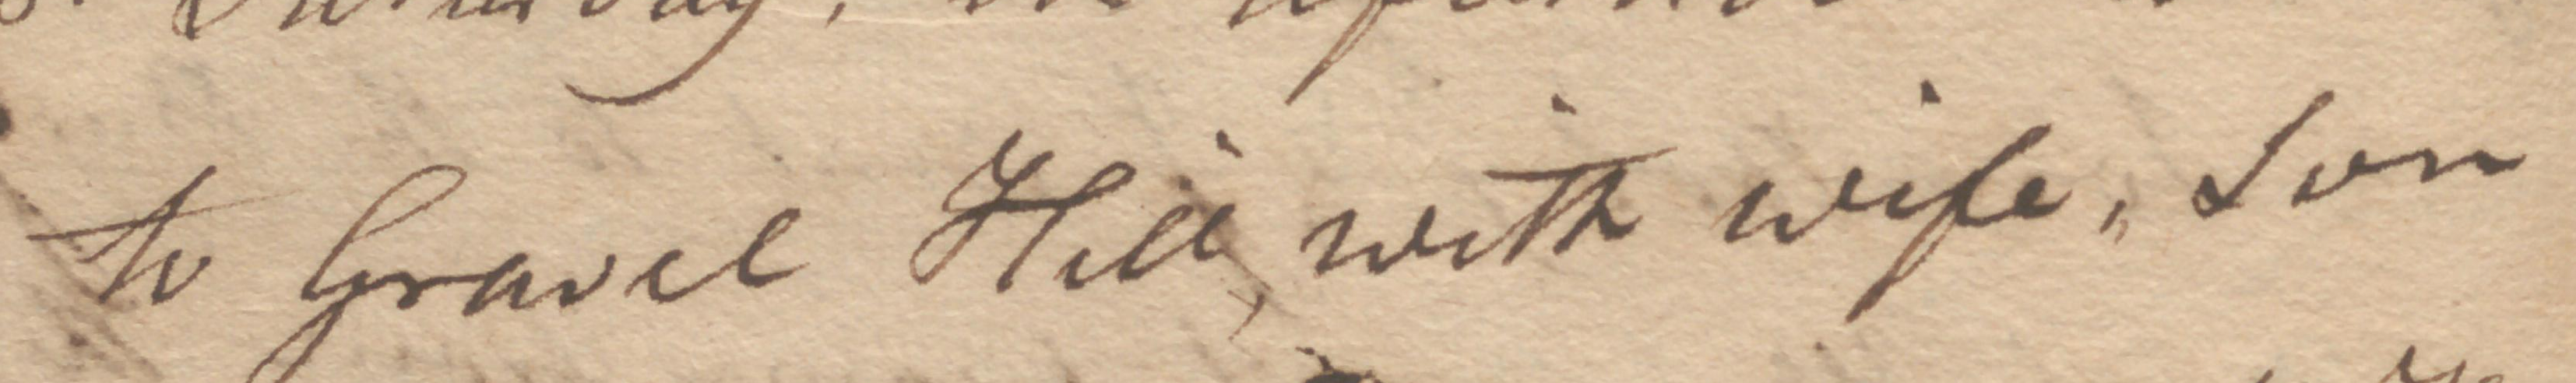to Gravel Hill with wife, son
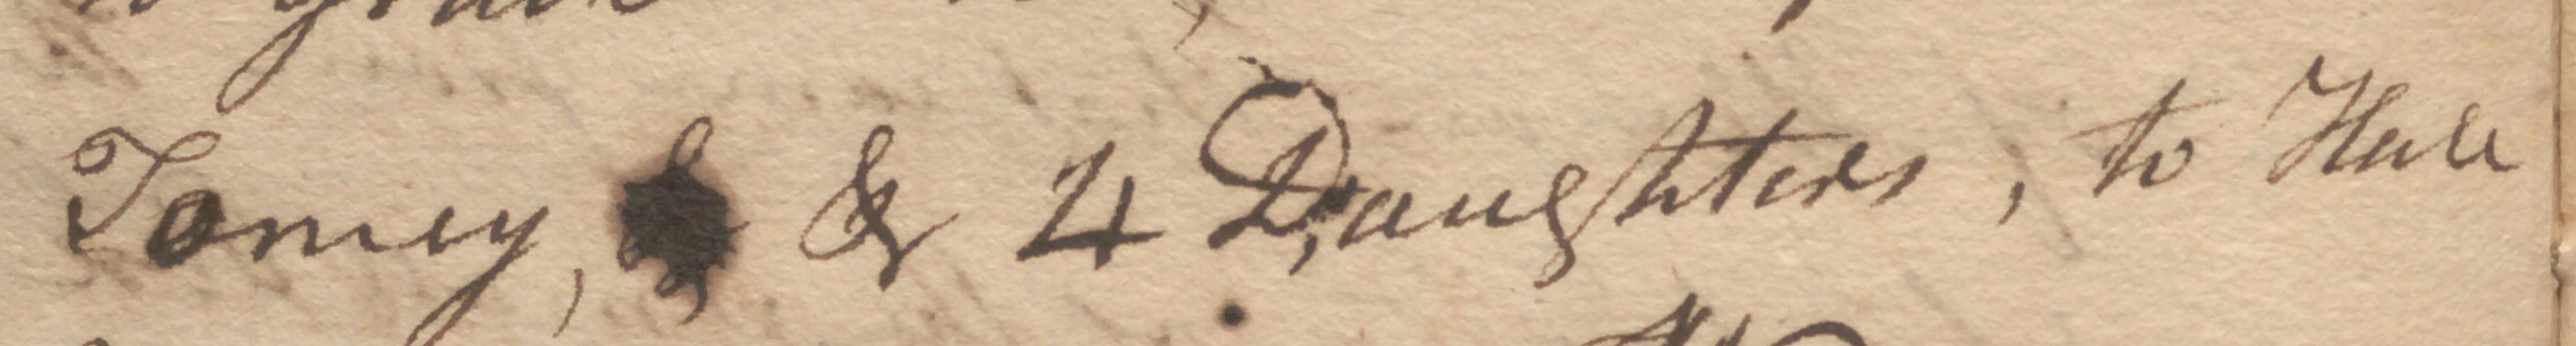Tomey [&] & 4 Daughters, to Hale
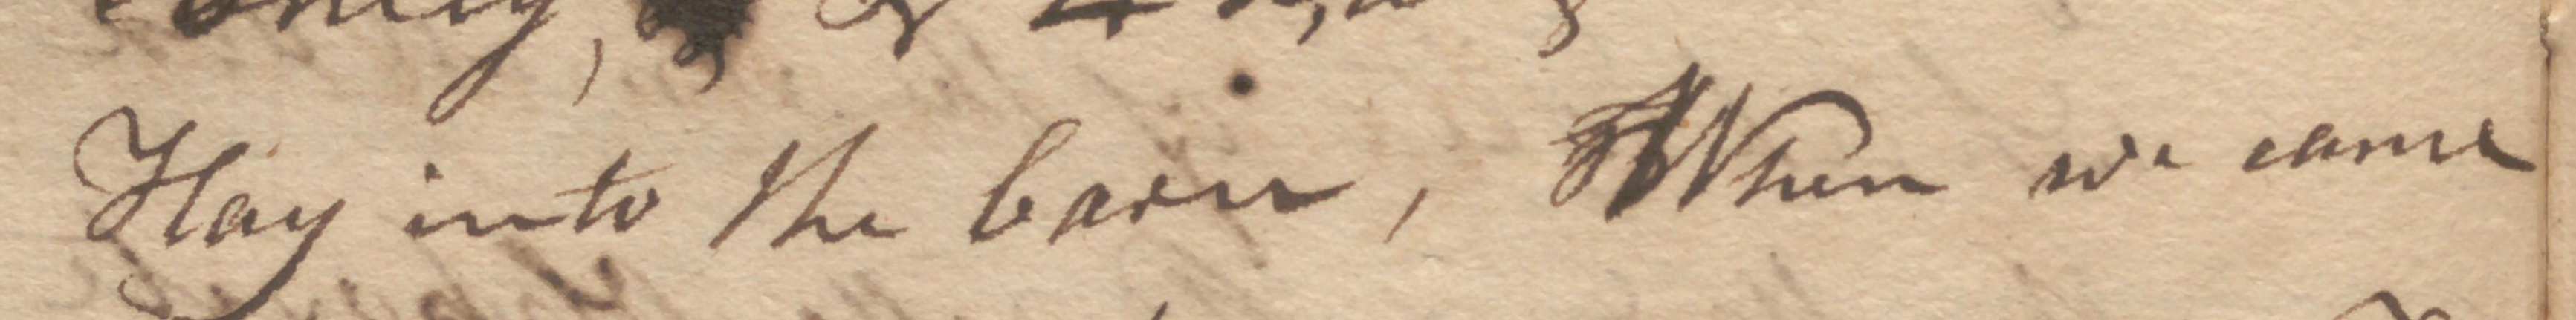Hay into the barn, When we came
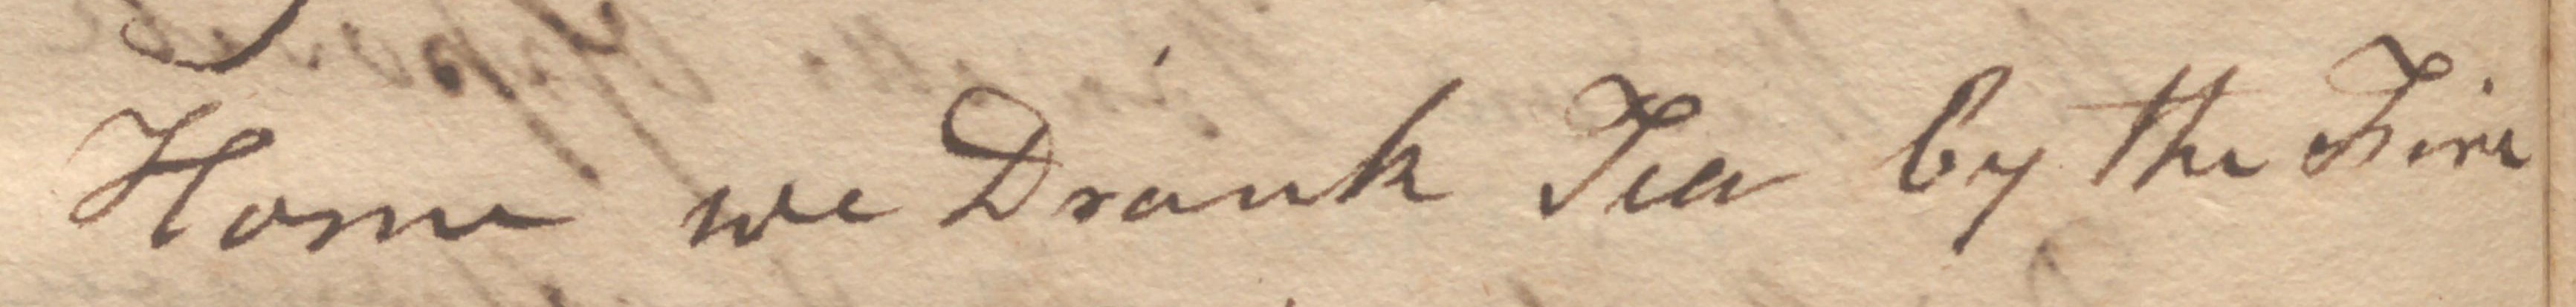Home we Drank Tea by the Fire
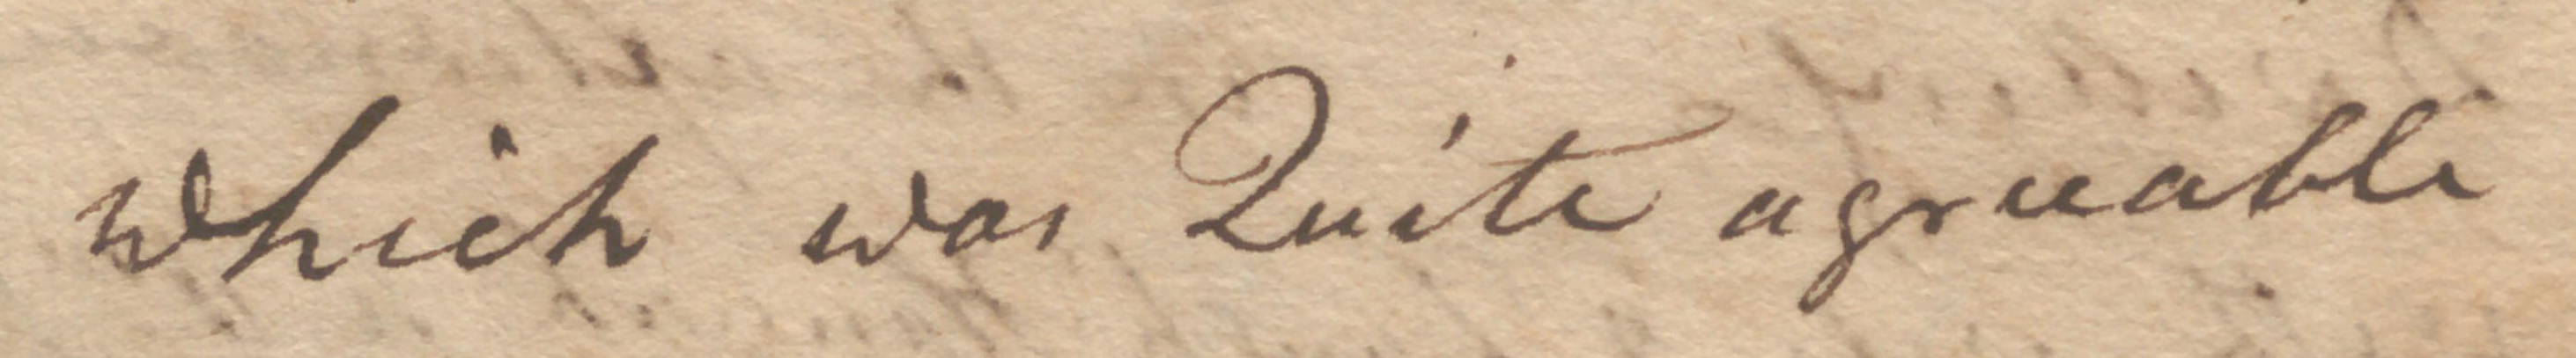which was Quite agreeable
